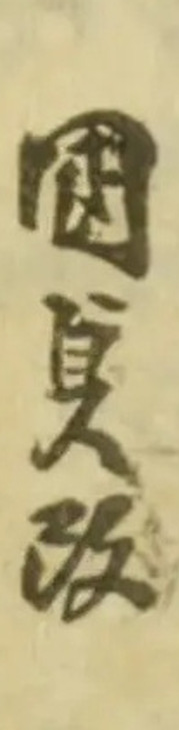国貞改
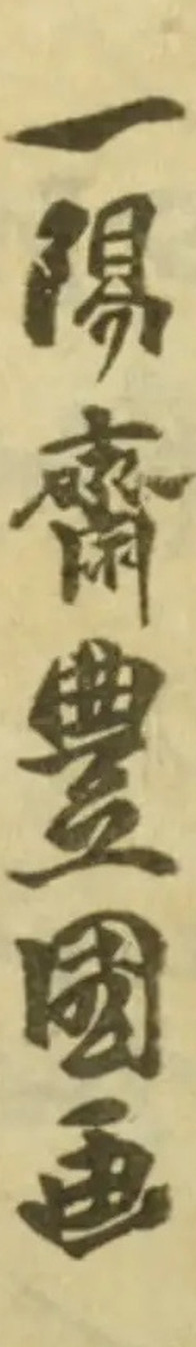一陽斎豊国画
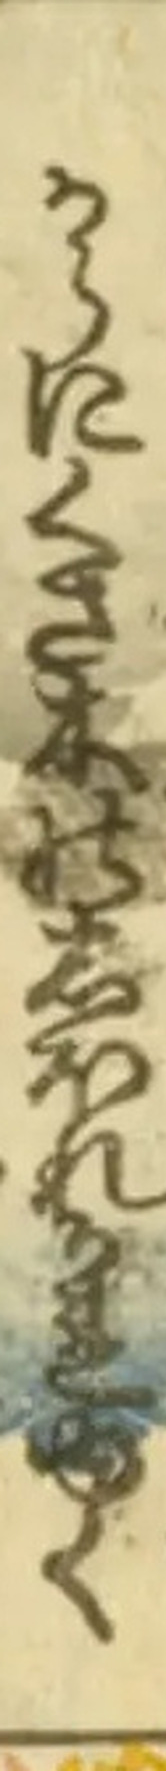からにくさ木のしほれかれゆく
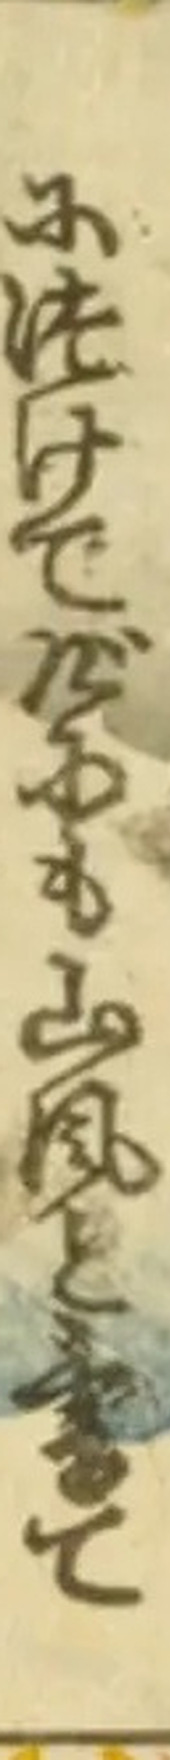につけてげにも山風と書て
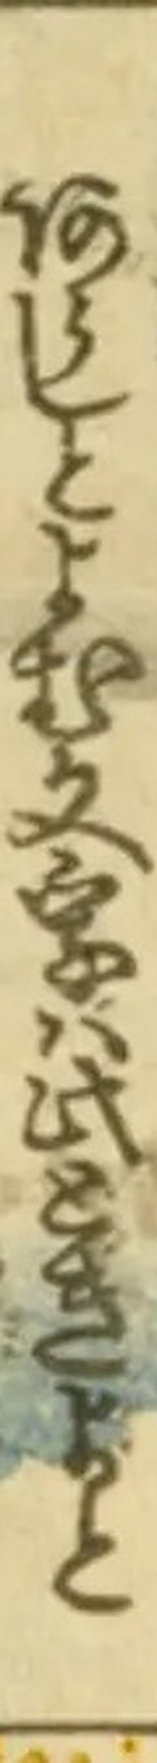あらしとよむ文字は此ときよと
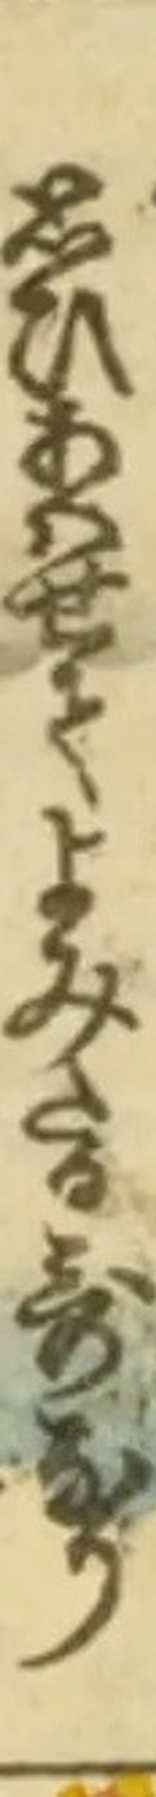思ひあはせてよみたる歌なり
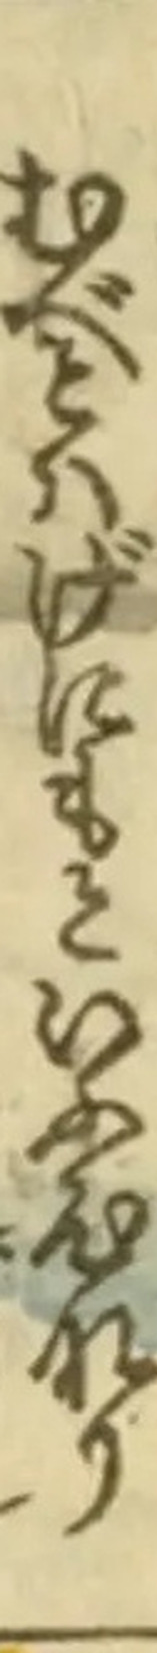むべとはげにもといふ心なり
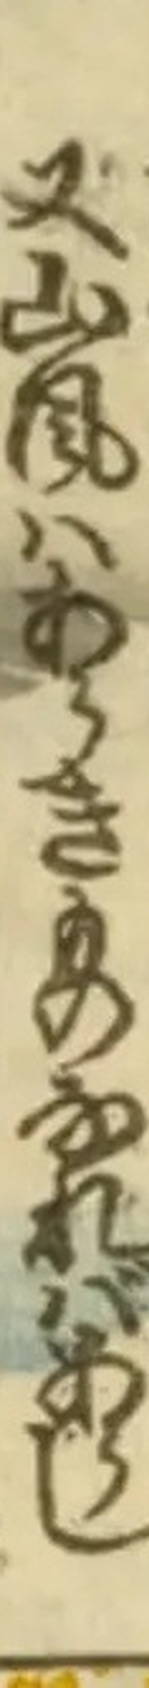又山風はあらきものなればあらし
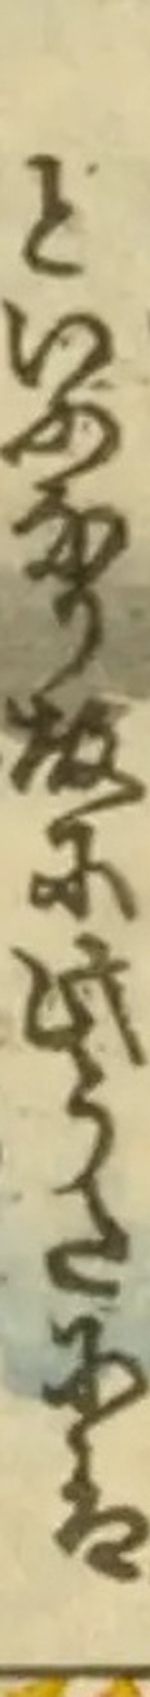といふなり故に此うたには
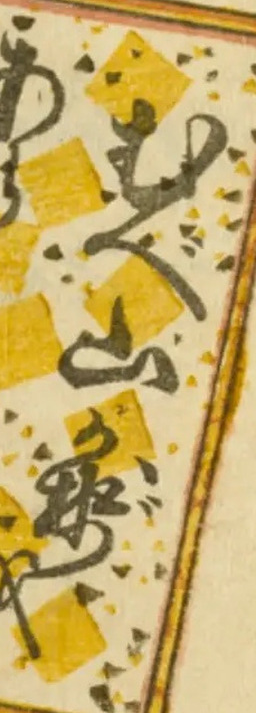むべ山かぜ
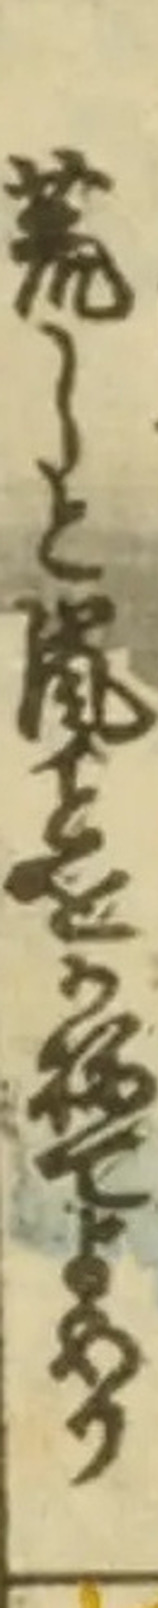荒らしと嵐とをかねてよめり
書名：百人一首絵抄　廿二　文屋康秀
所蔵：国立国会図書館 National Diet Library, JAPAN
